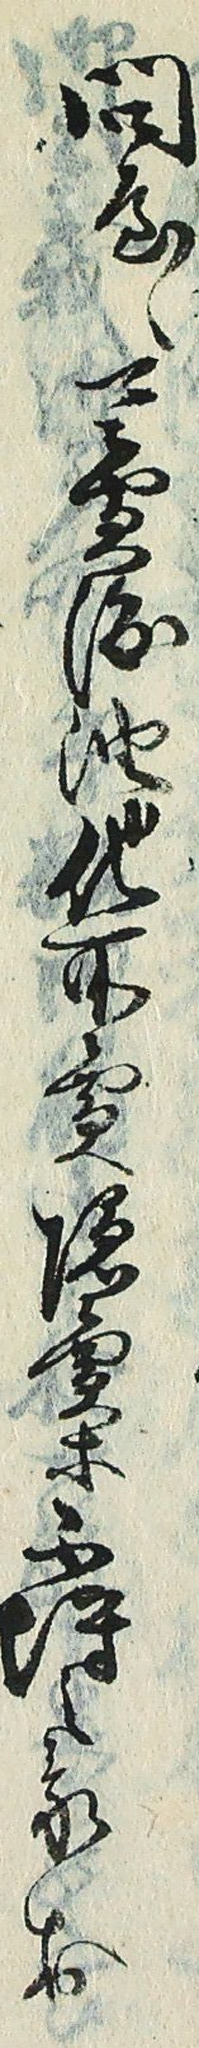問屋へ可売渡油他所売隠売等不埒之義於
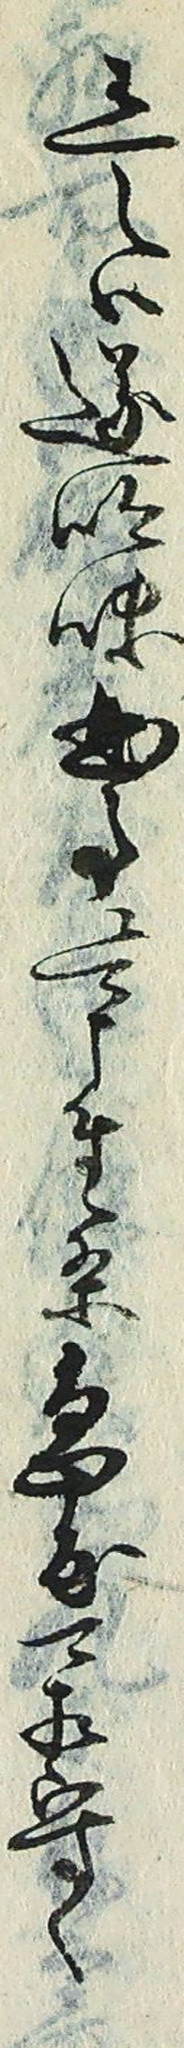有之は遂吟味曲事に可申付候条急度可相守候
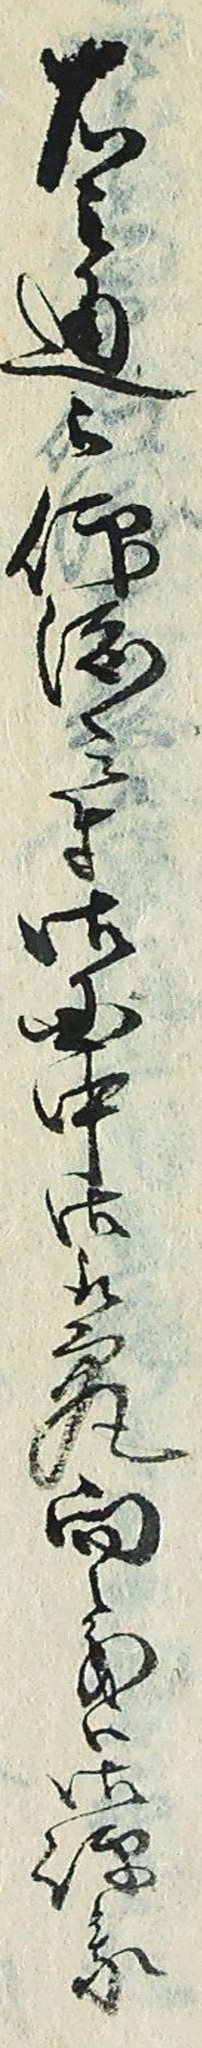右之通被仰渡候に付御国中御取究向之義は御評義
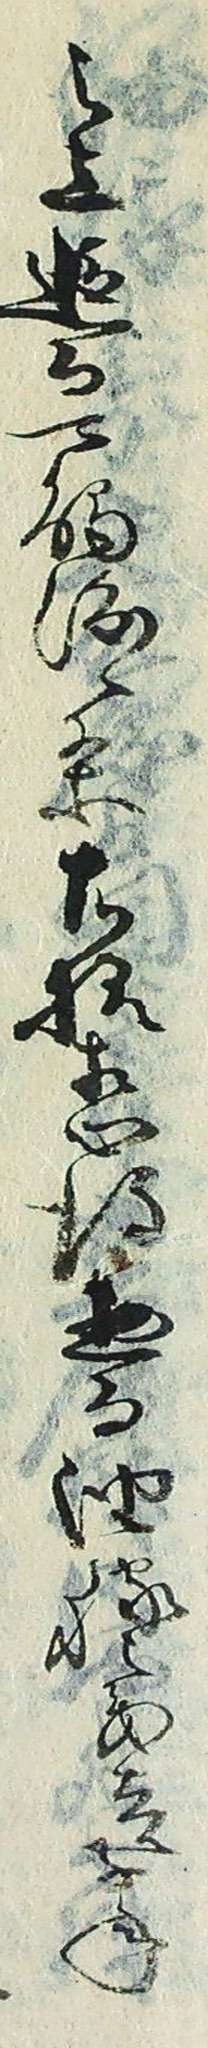之上追而可触渡候条左様相心得惣而油稼之義去る子年
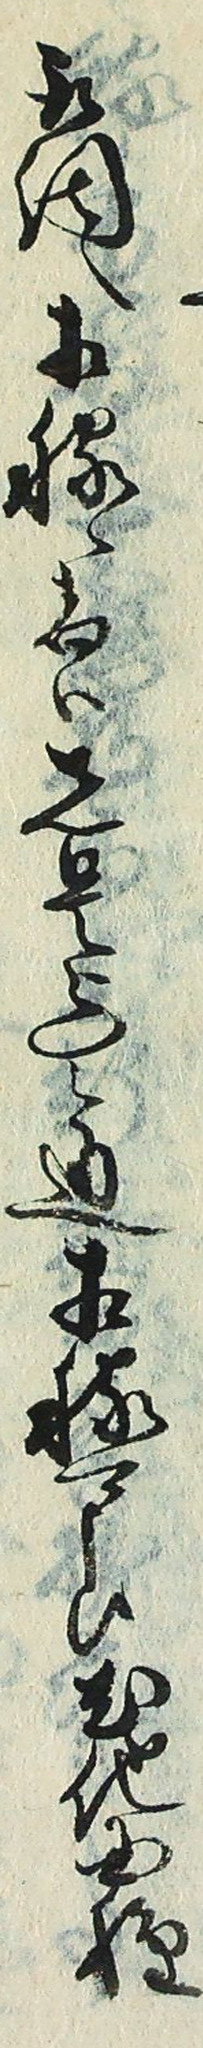取調へ相稼候者は先是迄の通相稼可申候尤他国種
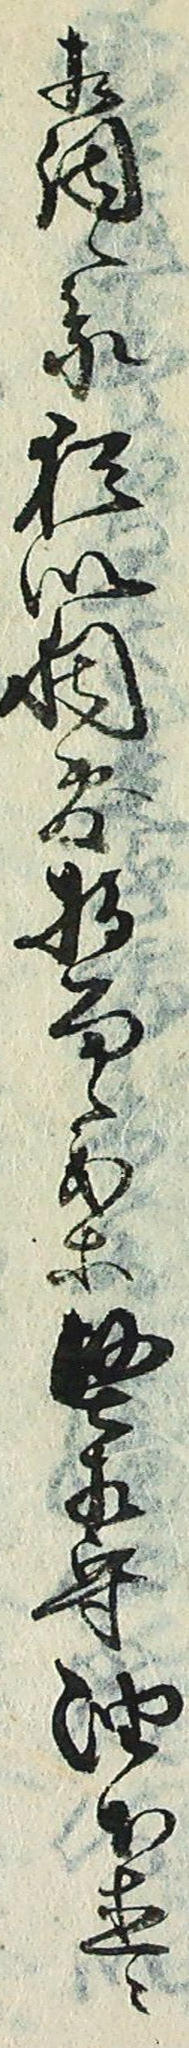相調候義猶以稠敷指留候義等堅相守油下直に
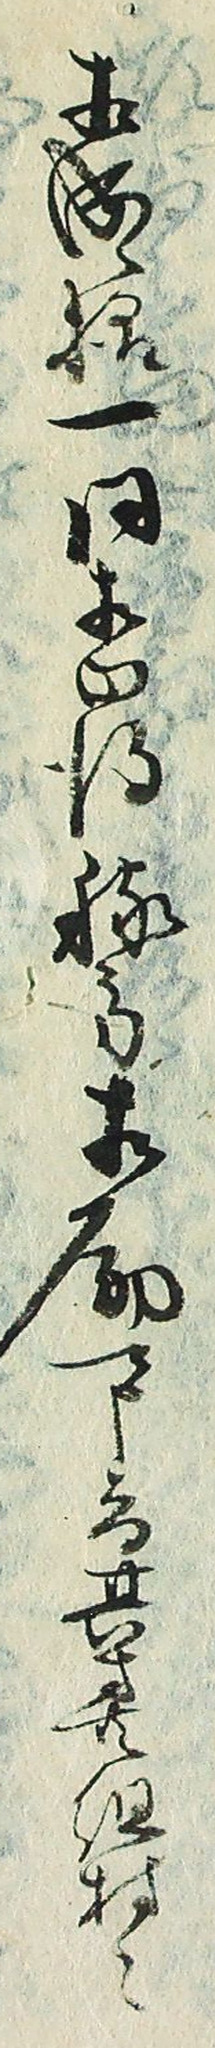相成候様一同相心得稼方相励可申旨其方共組村々
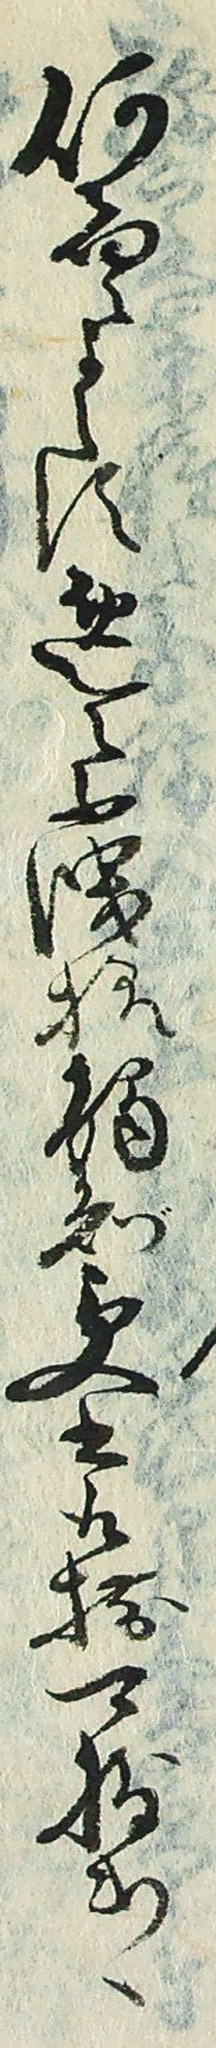何者によらす逸々不洩様触知受書取揃可指出候
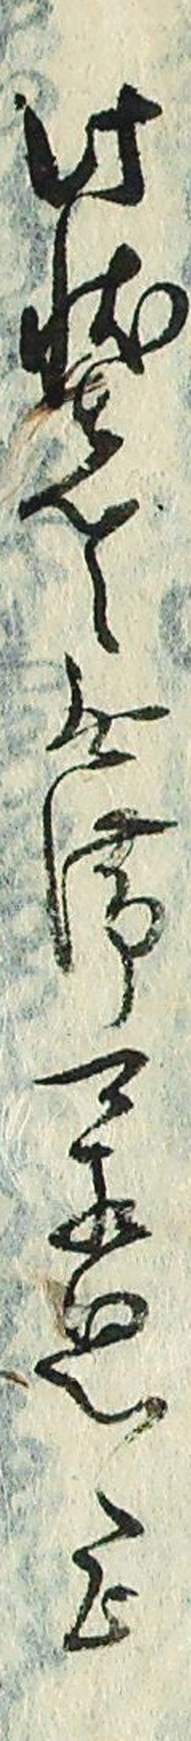此状先々無滞可相廻候以上
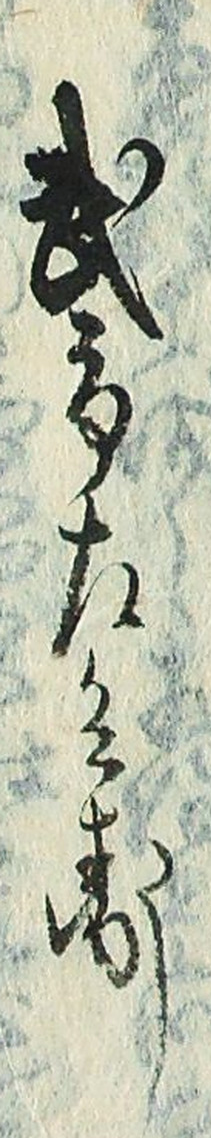武市左兵衛
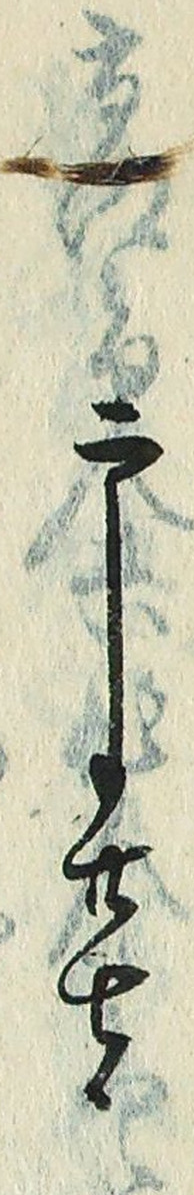二月廿七日
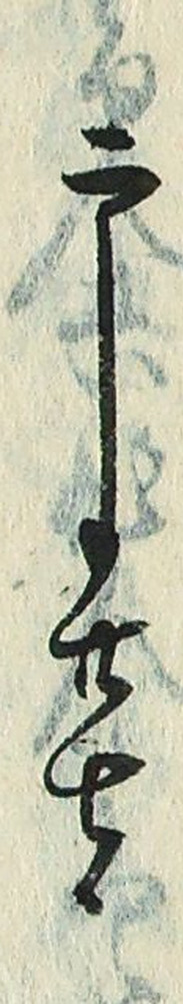二月廿七日
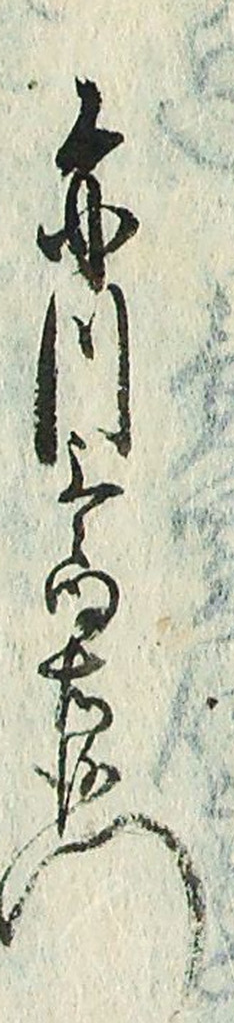赤川上三郎右衛門
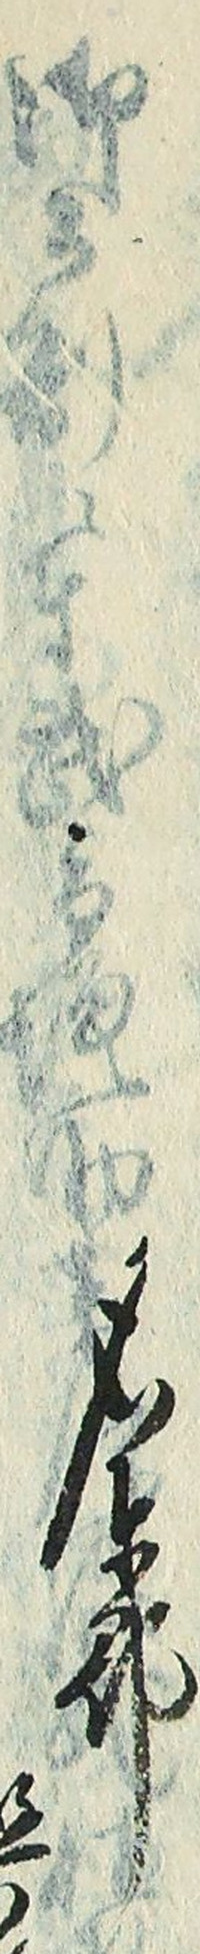名東郡
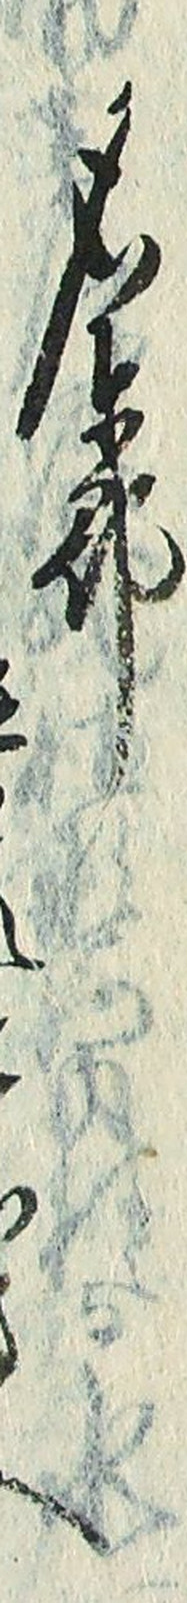名東郡
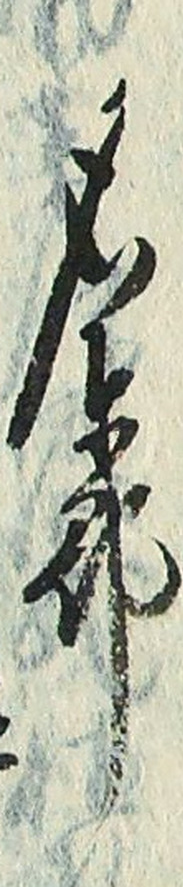名東郡
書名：油稼御取究ニ附御箇條書テ以被仰渡南北同役申談御答書控
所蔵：鳴門教育大学 Naruto University of Education
